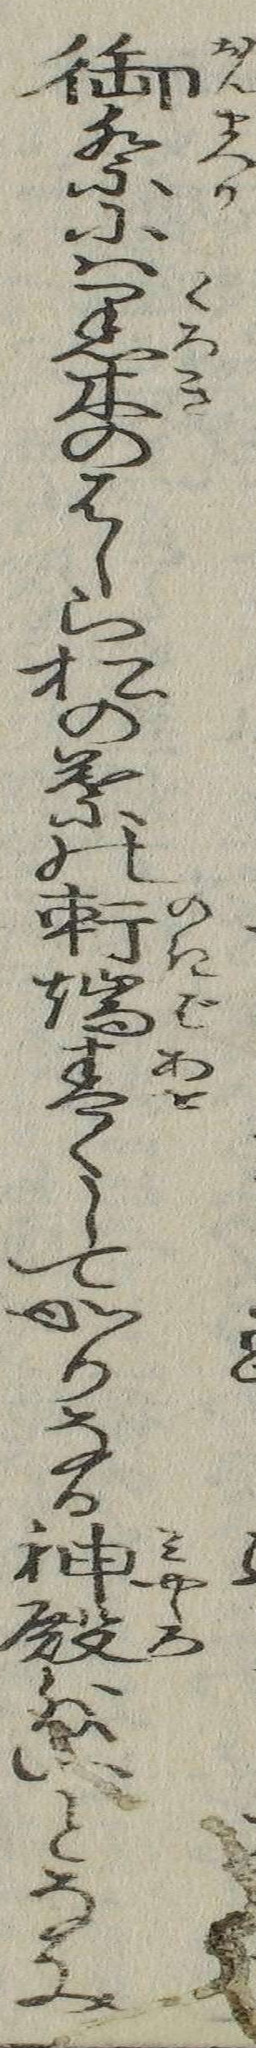御祭には黒木のはしら松の葉の軒端青くしてかりなる神殿をいとなみ
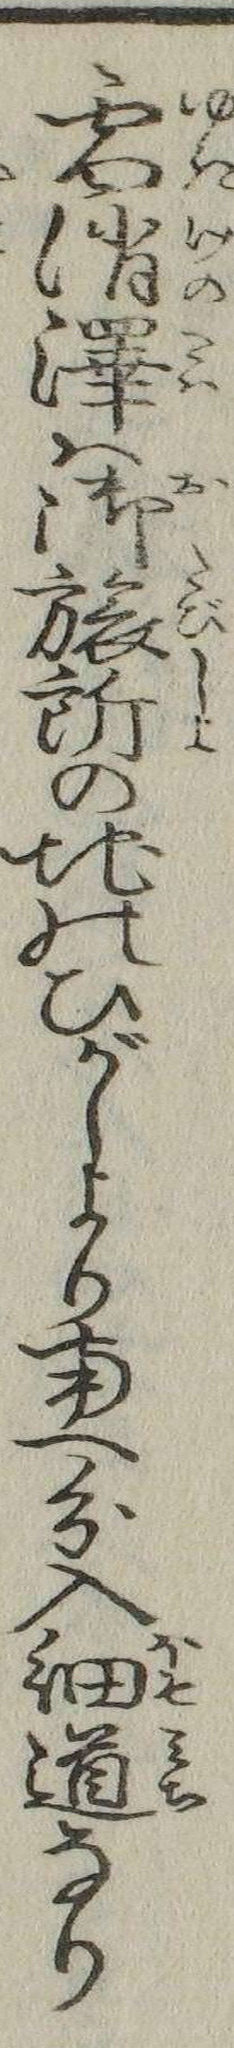雪消澤は御旅所の地のひがしより南へ分入細道なり
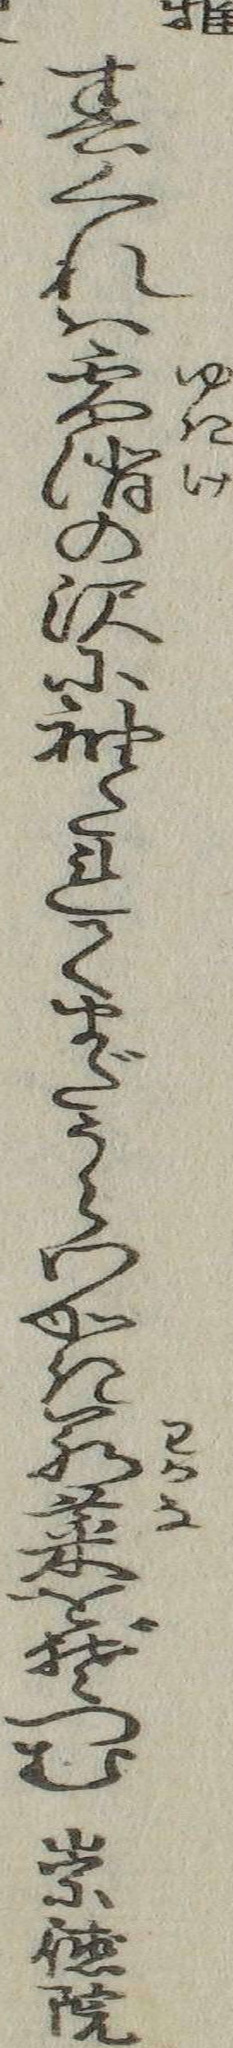春くれは雪消の沢に袖たれてまだうらわかき若菜をぞつむ崇徳院
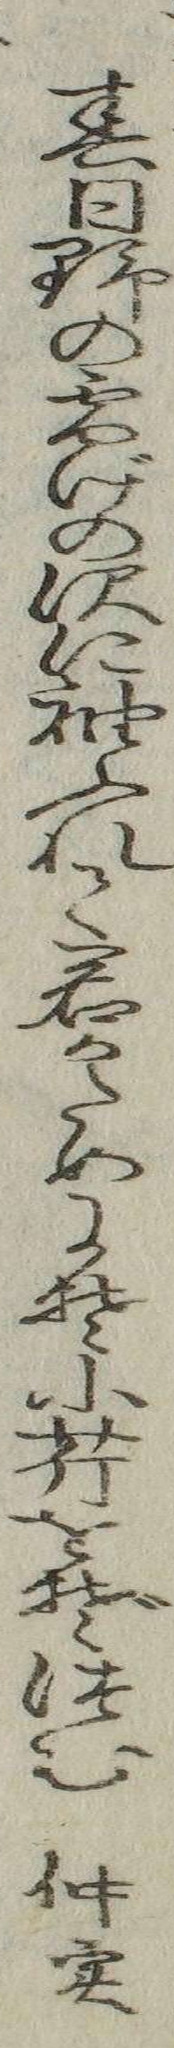春日野の雪げの沢に袖ふれて君かためにそ小芹をぞつむ仲實
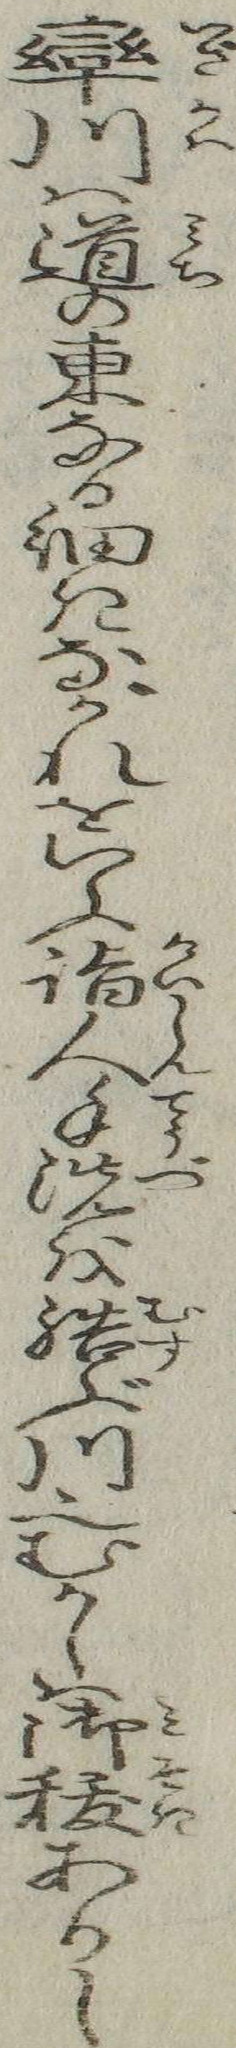卛川は道の東なる細きながれをいふ詣人手洗を結ぶ川也むかしは御祓ありし
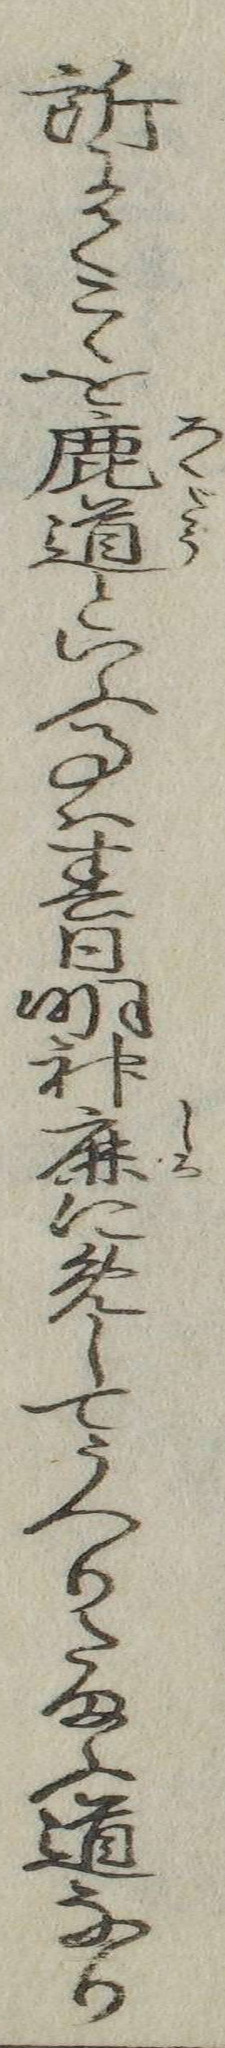所にてこゝを鹿道といふ事は春日明神鹿にめしてうつりたまふ道なり
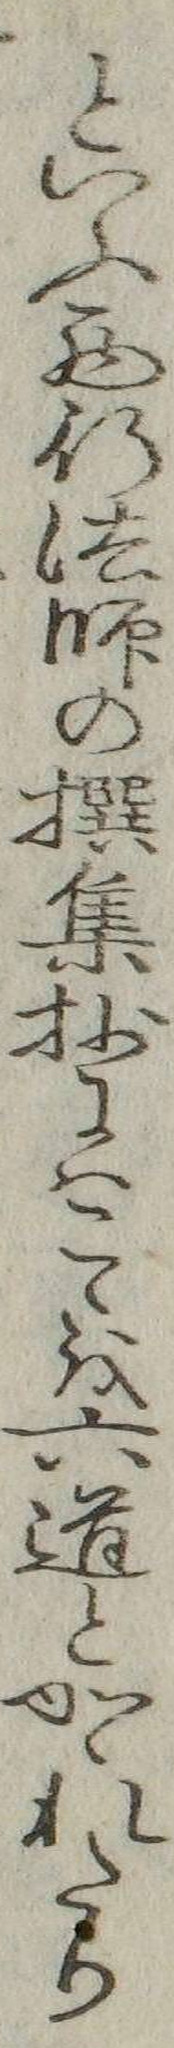といふ西行法師の撰集抄にはこゝを六道とかゝれたり
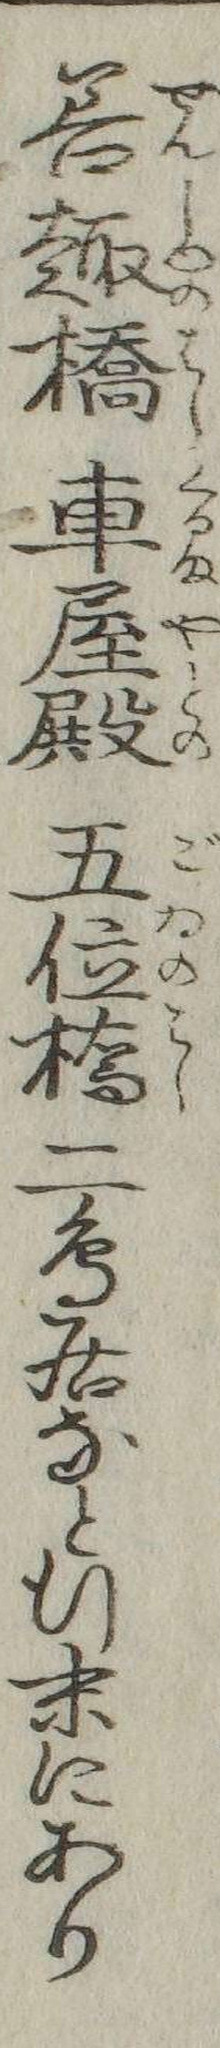善趣橋車屋殿五位槗二鳥居なと行末にあり

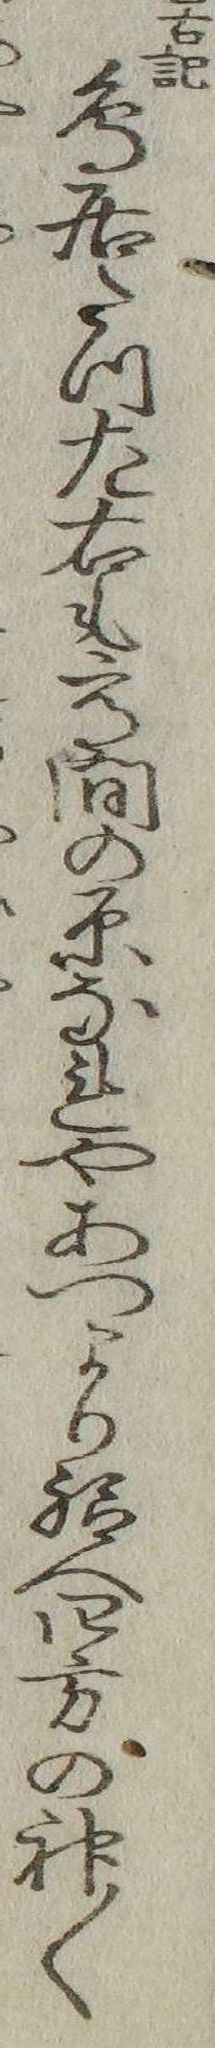鳥居たつ左右も高間の原なれやあつまり給へ四方の神〳〵
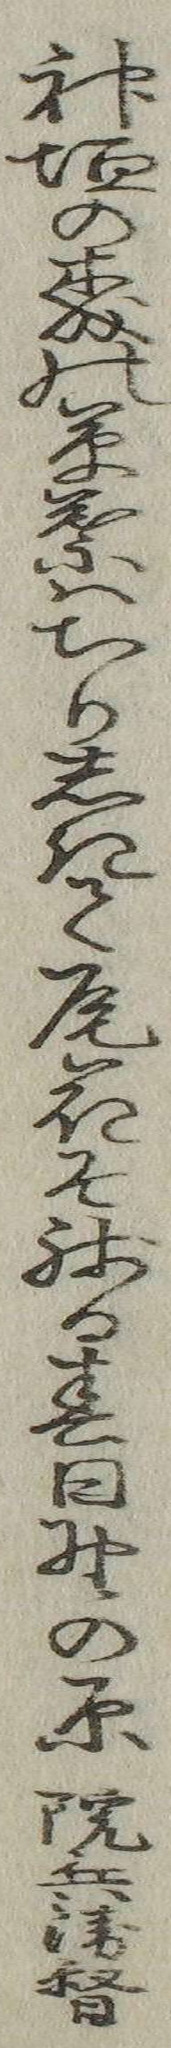神垣の森の草葉はちりしきて尾花そ残る春日野の原院兵衛督
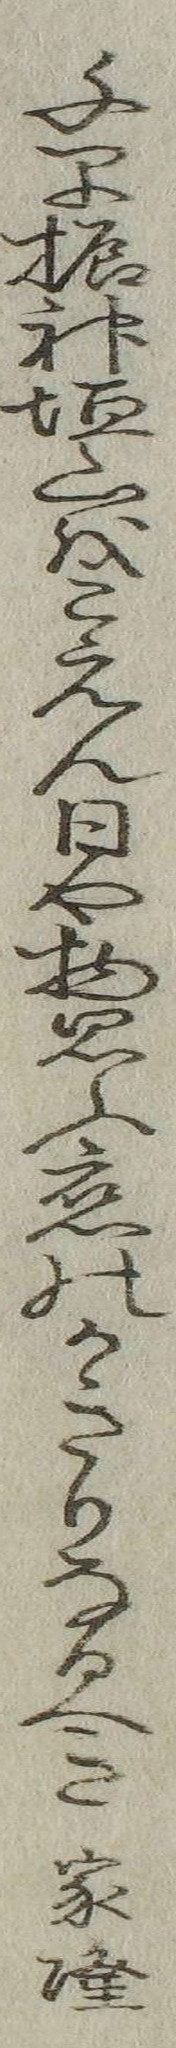千早振神垣山をこえん日や物思ふ恋のかきりなるへき家隆
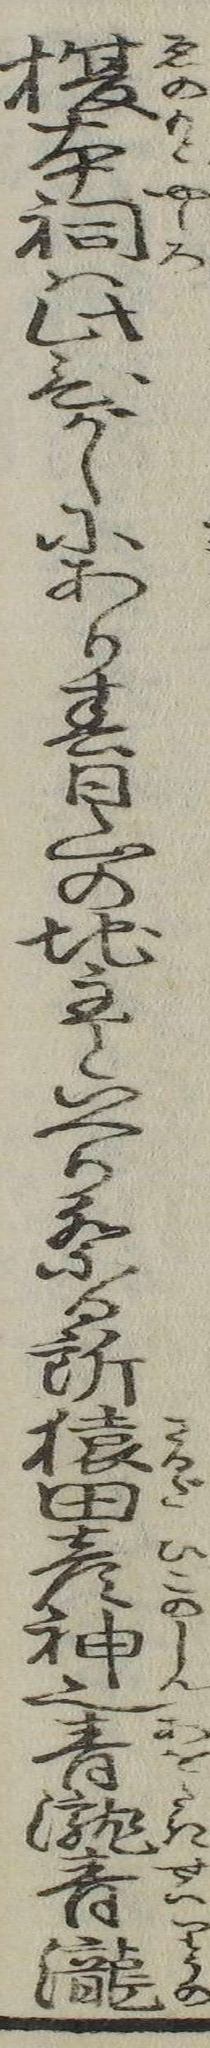榎本祠は此ひがしにあり春日山の地主といへり祭る所猿田彦神𬻿青瀧青瀧
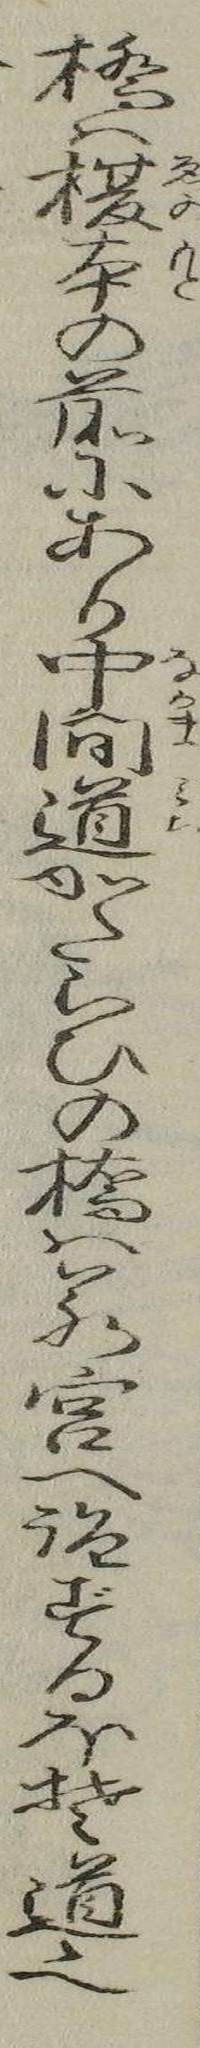橋は榎本の前にあり中間道かたらひの槗は若宮へ詣ずるほそ道𬻿
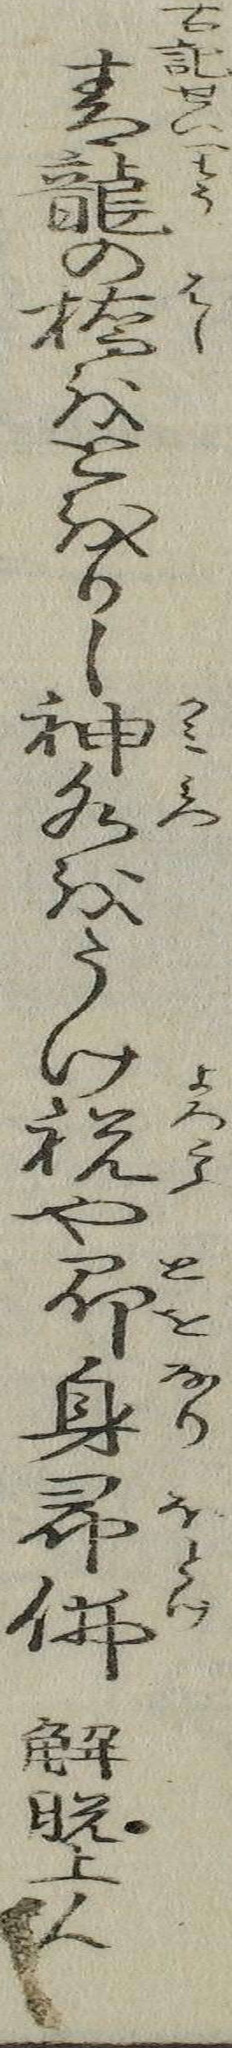青龍の槗をとをりし神水をうけ祝や即身即佛解脱上人
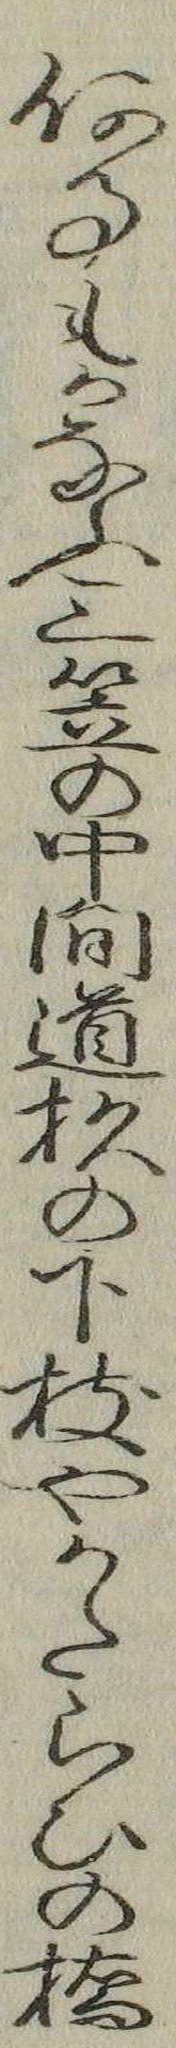何事もかなふ三笠の中間道杦の下枝やかたらひの槗
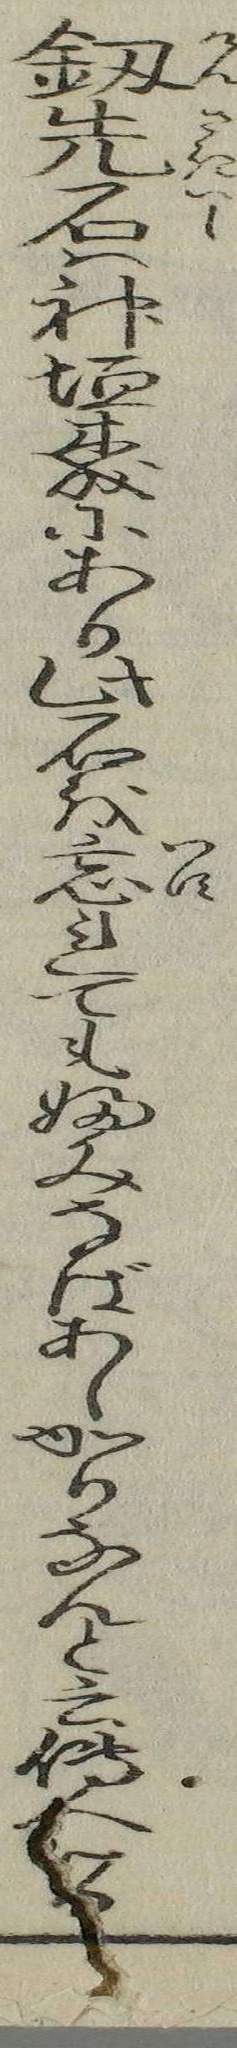釼先石は神垣森にあり此石を忘れてもふみなばあしかりなんと云傳へける
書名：大和名所圖會
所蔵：国文学研究資料館
